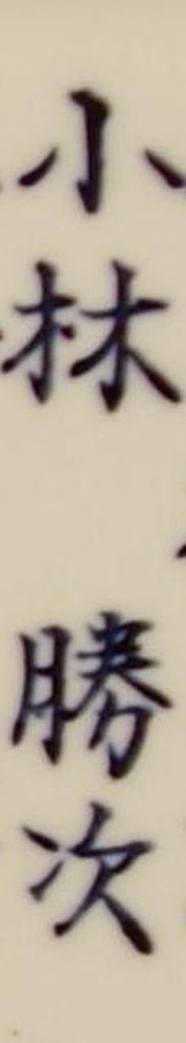小林勝次
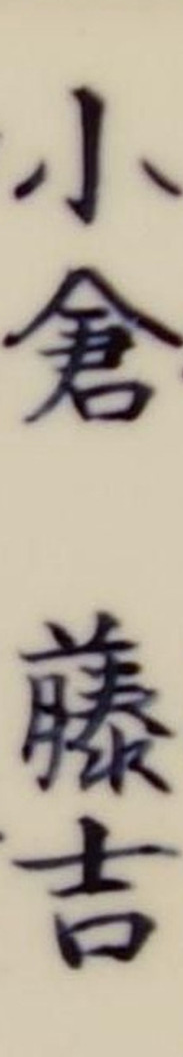小倉藤吉
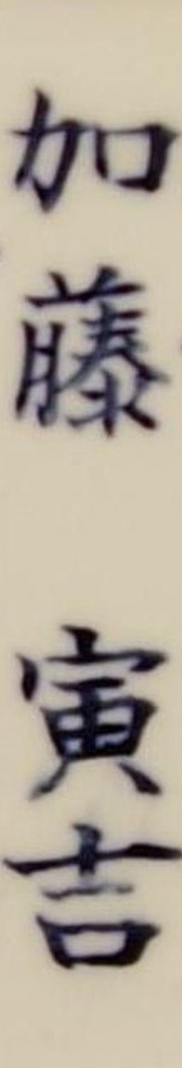加藤寅吉
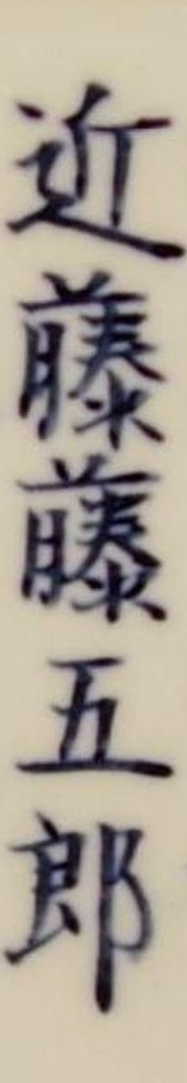近藤藤五郎
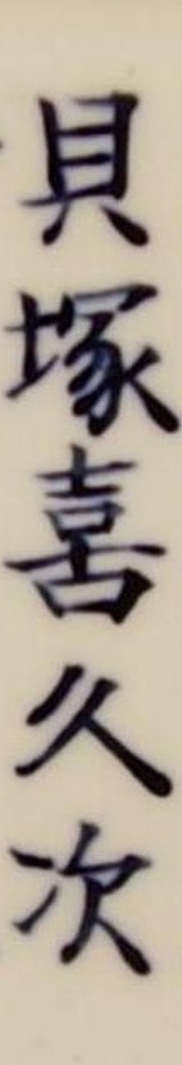貝塚喜久次
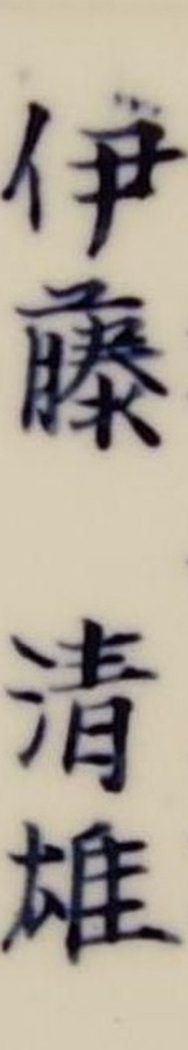伊藤清雄
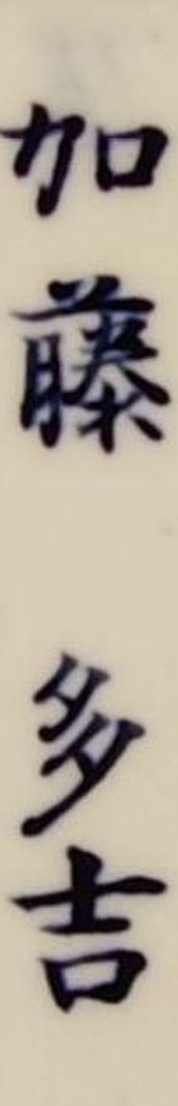加藤多吉
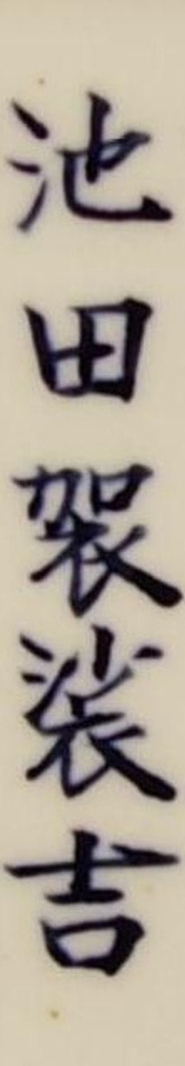池田袈裟吉
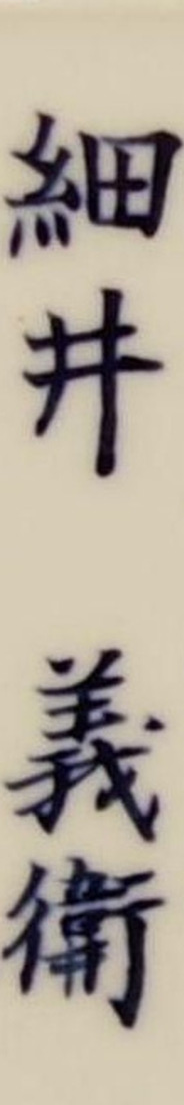細井義衛
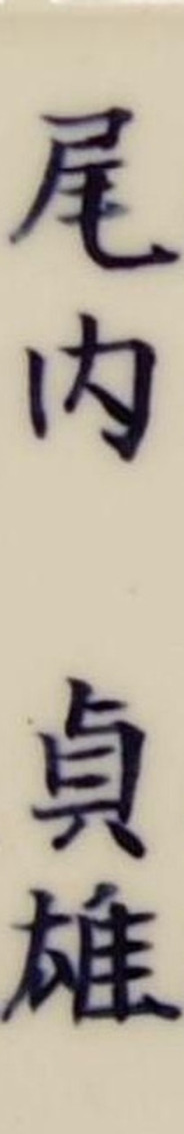尾内貞雄
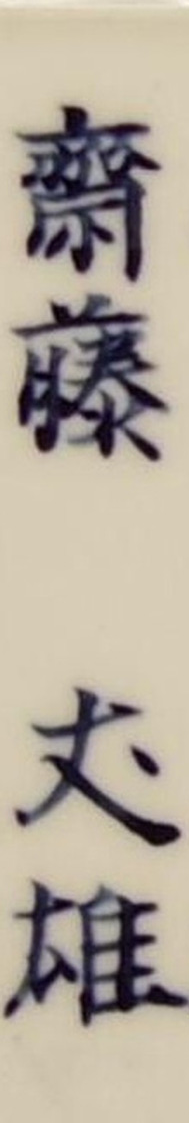斎藤丈雄
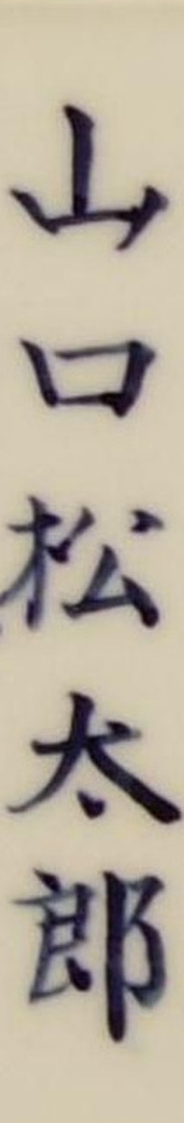山口松太郎
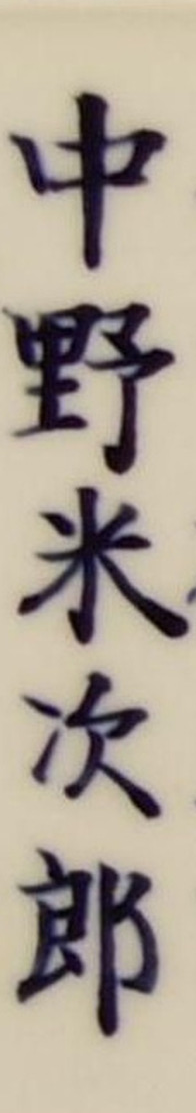中野米次郎
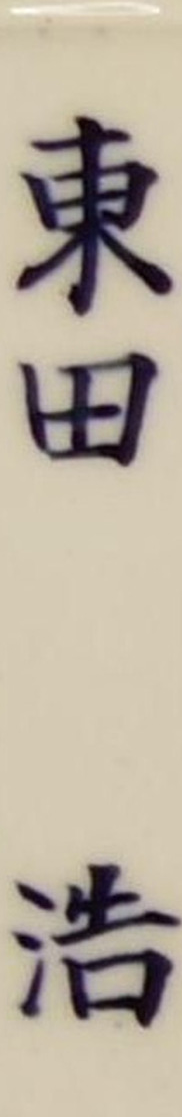東田浩
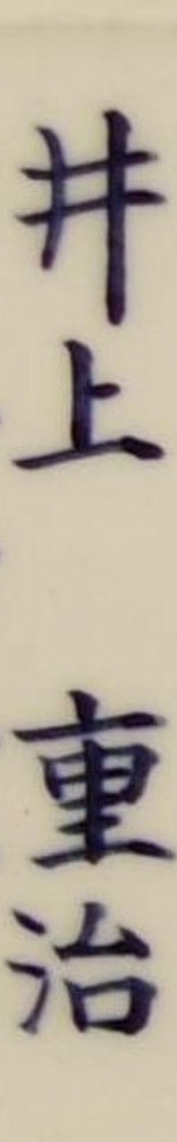井上重治
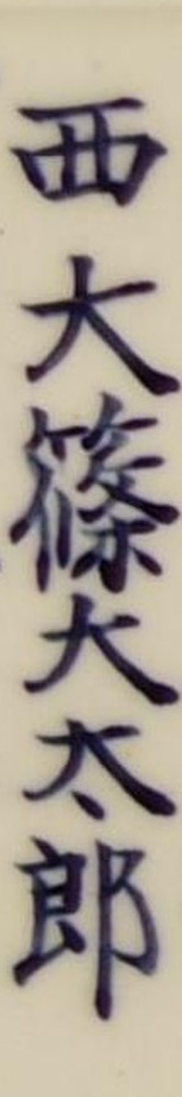西大篠大太郎
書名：E~L
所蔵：高野山金剛峯寺
